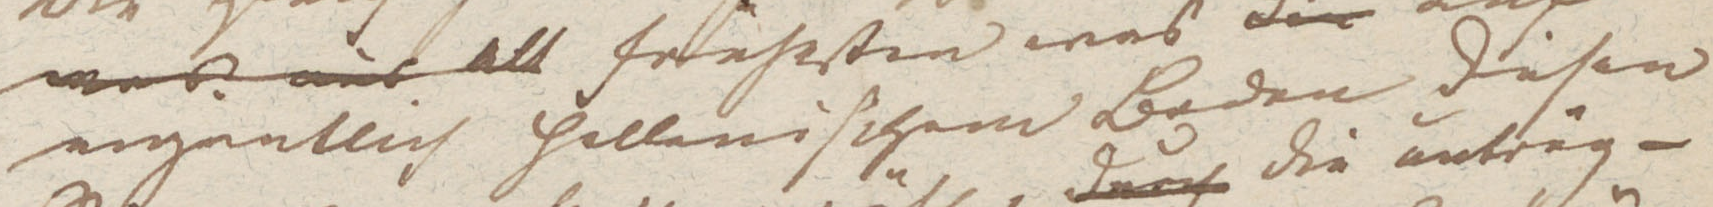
eigentlich Hellenischem Boden diesen
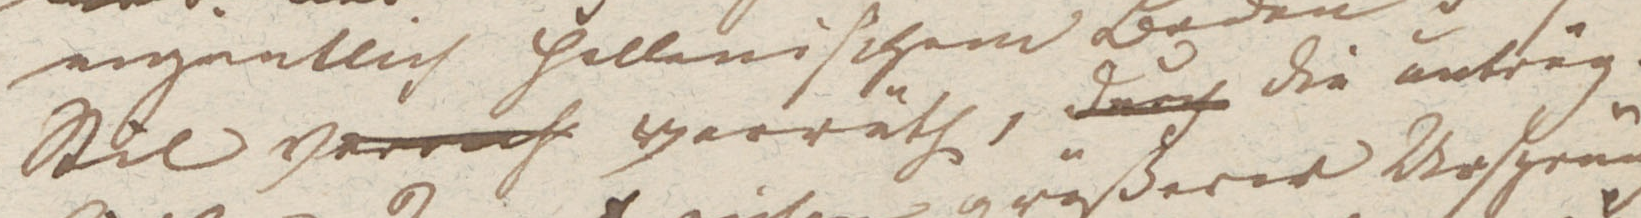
Stil verrah verräth, durch die untrüg-
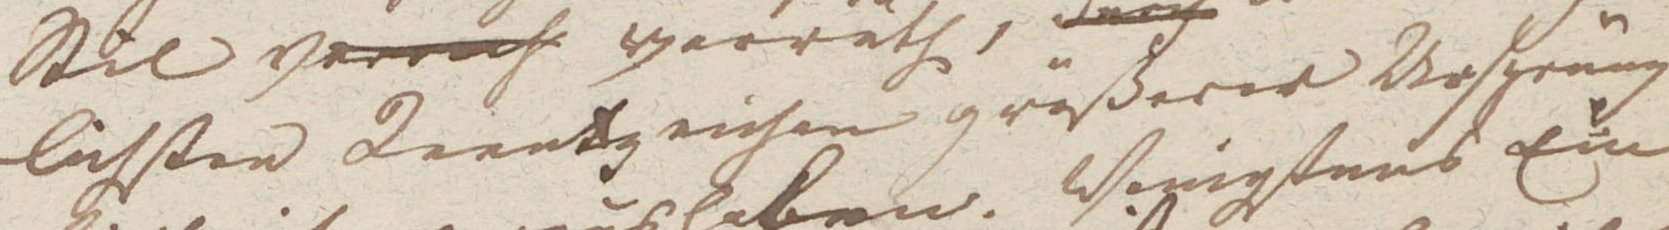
lichsten Kenntzeichen grösserer Urspüng-
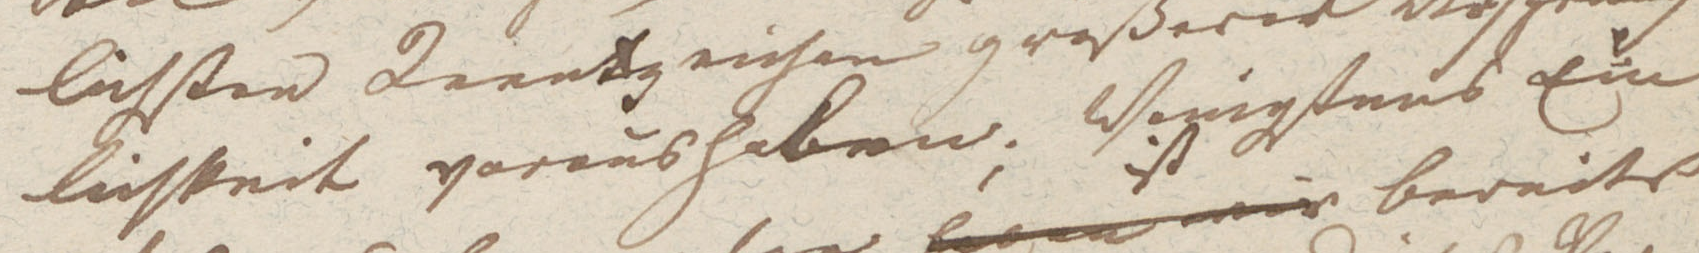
lichkeit voraushaben; Wenigstens Ein
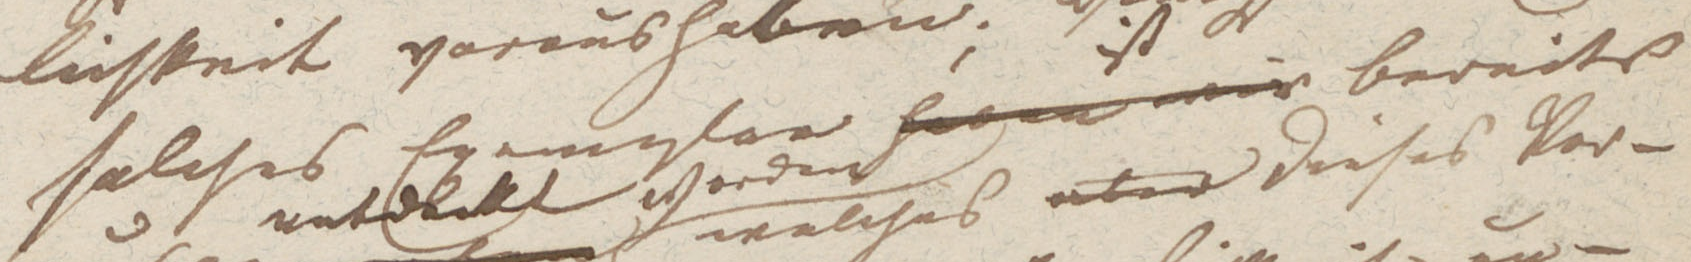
solches Exemplar haben wir ist bereits
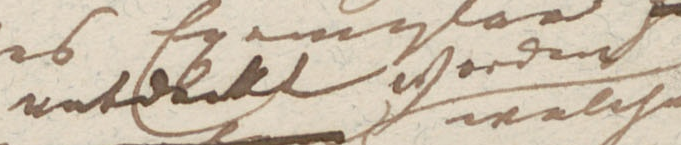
entdeckt worden
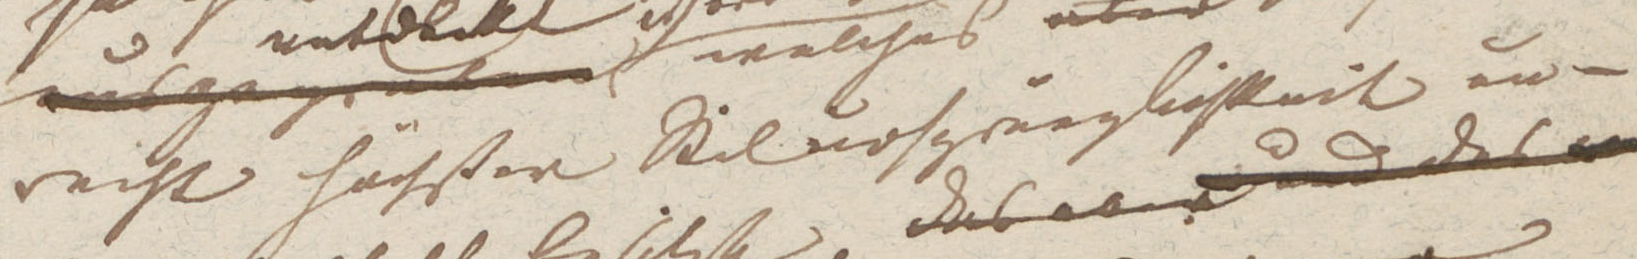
recht höchster Stilursprünglichkeit un-
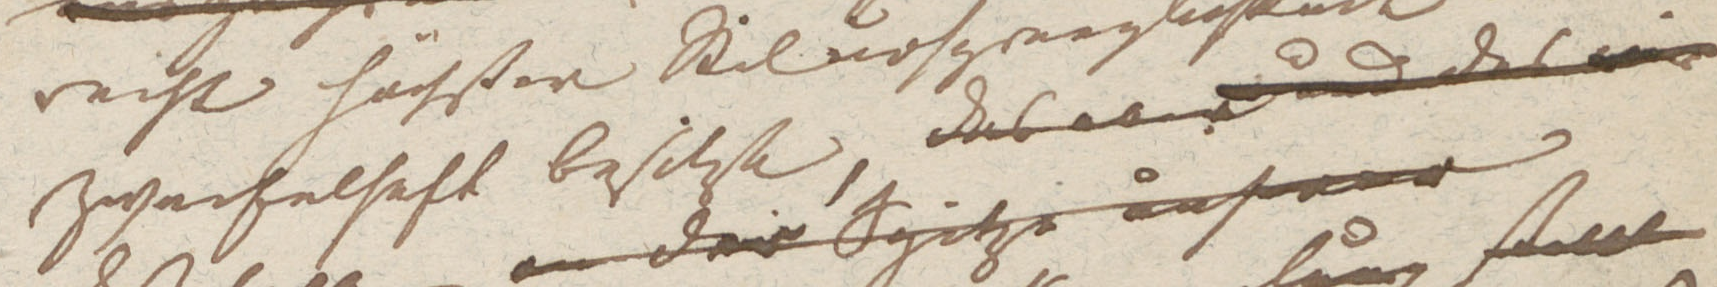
zweifelhaft besitzt, das aber und das ein
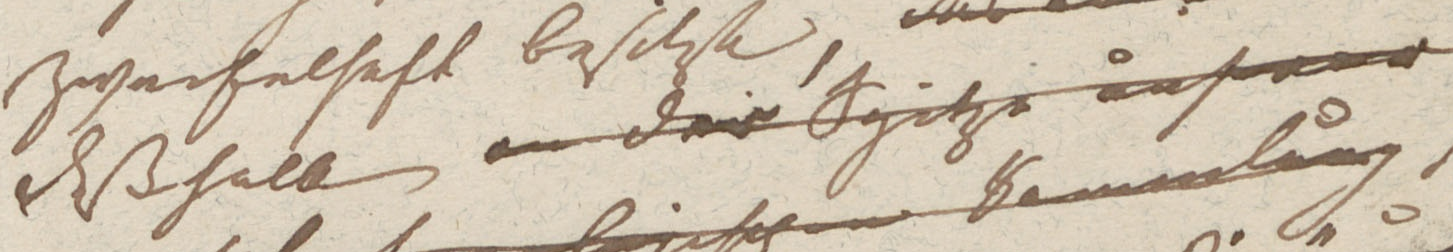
desshalb an der Spitze unserer
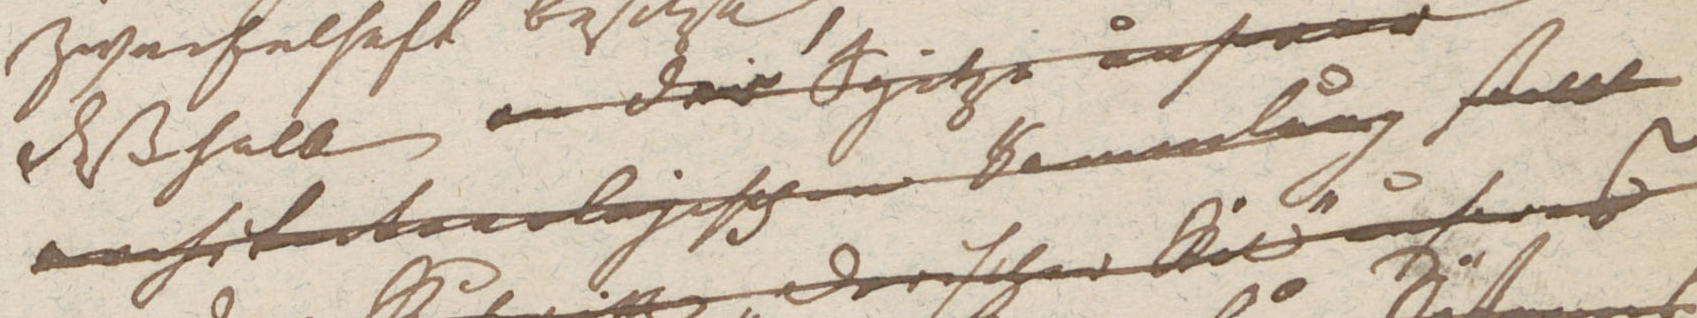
architectonologischen Sammlung stelle
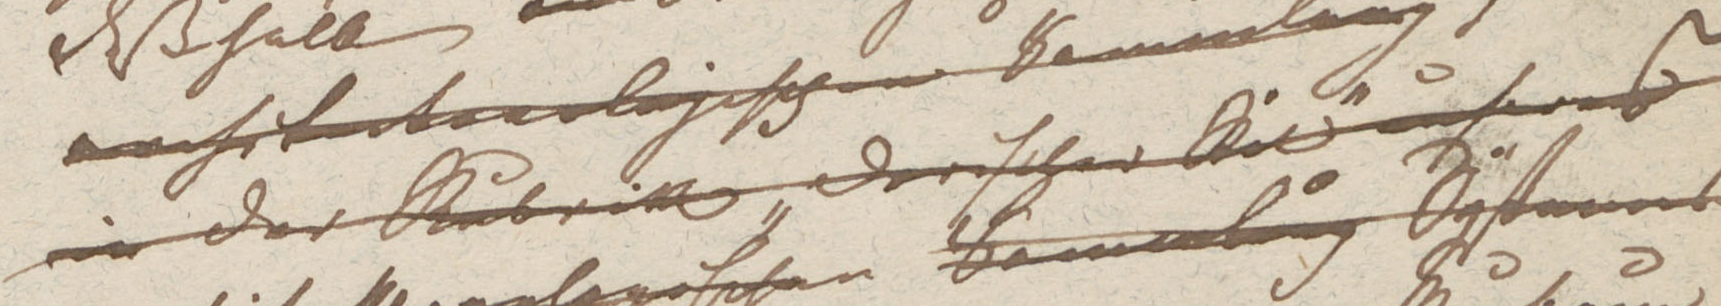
in der Rubrik "Dorischer Stil" unseres
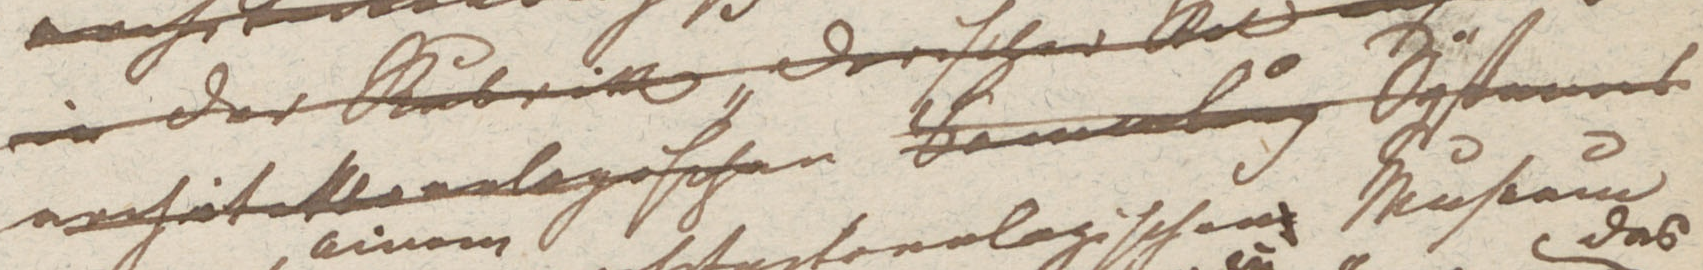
architektonologischen Sammlung Systemes
